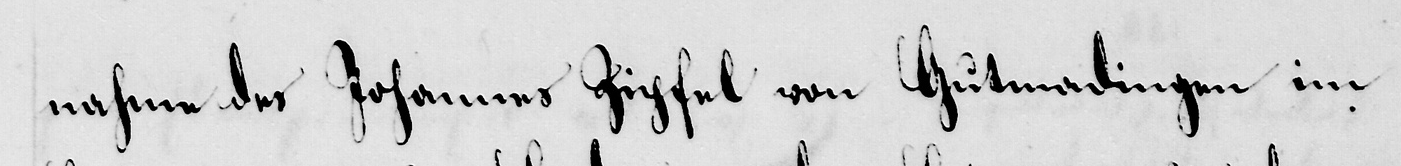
nahme des Johannes Zipfel von Gutmadingen im
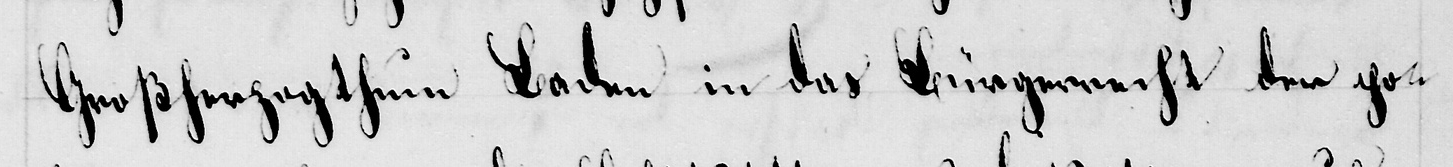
Großherzogthum Baden in das Bürgerrecht der po¬
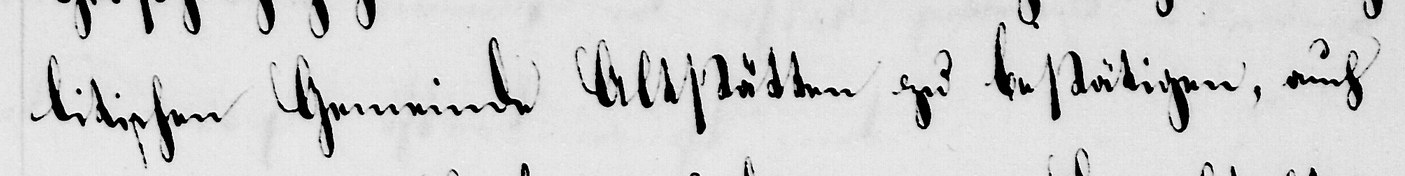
litischen Gemeinde Altstätten zu bestätigen, auch
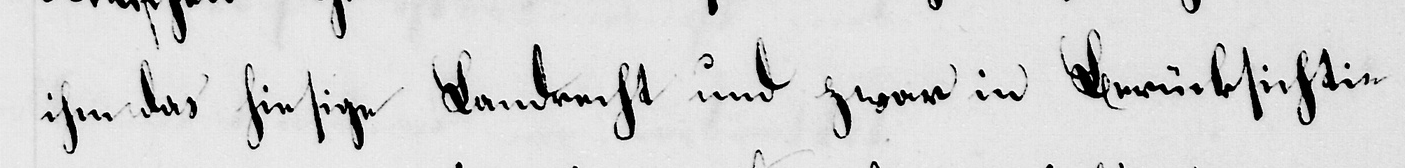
ihm das hiesige Landrecht und zwar in Berücksichti¬
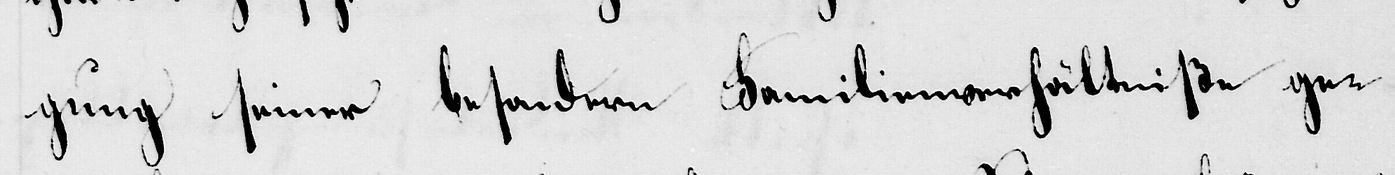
gung seiner besondern Familienverhältniße ge¬
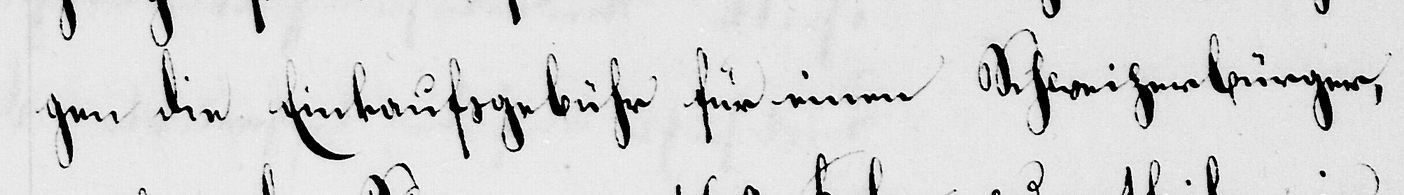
gen die Einkaufsgebühr für einen Schweizerbürger,
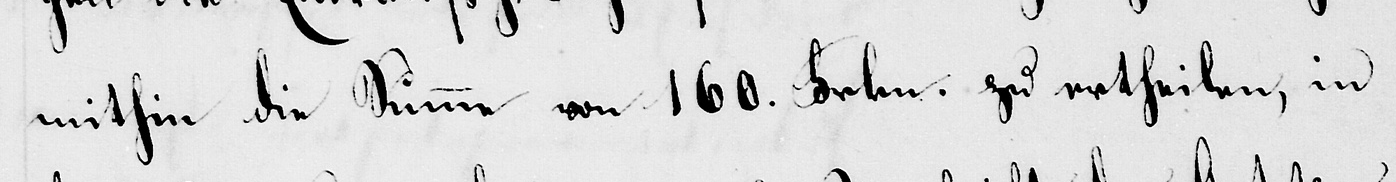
mithin die Summe von 160. Frkn. zu ertheilen, in
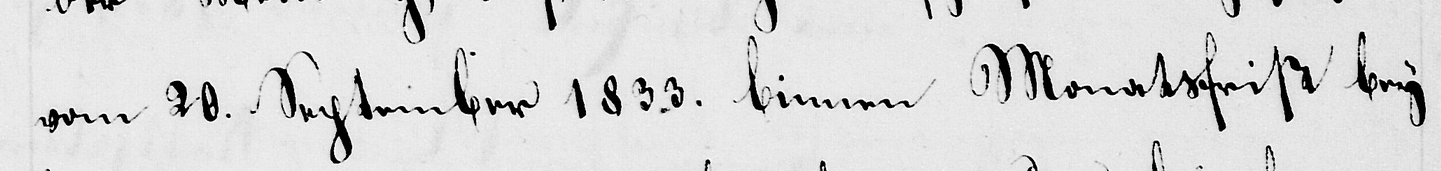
vom 20. September 1833. binnen Monatsfrist bey
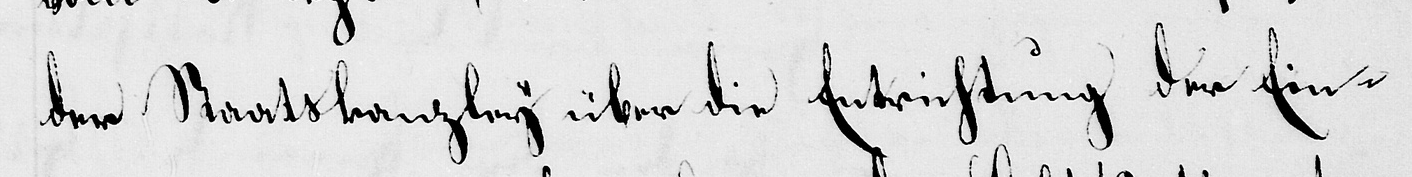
der Staatskanzley über die Entrichtung der Ein¬
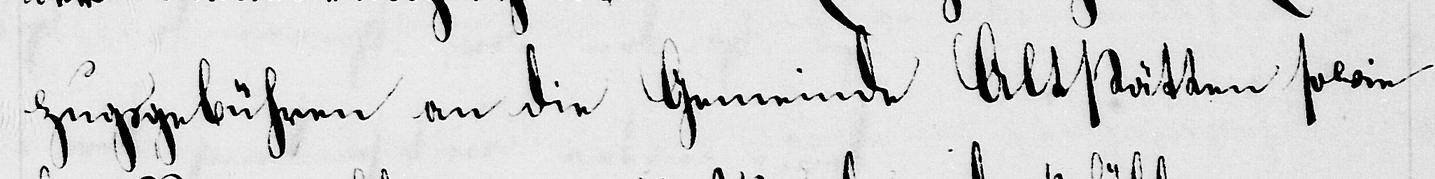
zugsgebühren an die Gemeinde Altstätten sowie
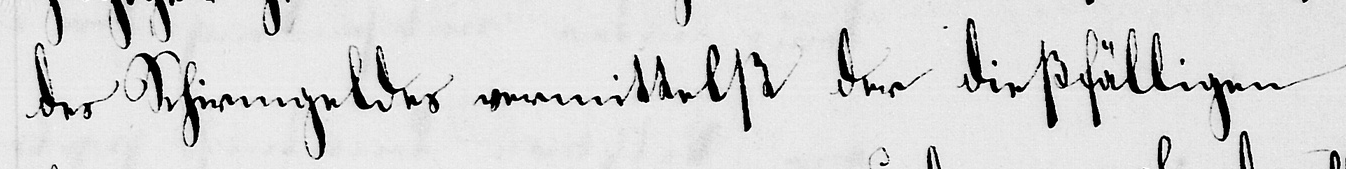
des Schirmgeldes vermittelst der dießfälligen
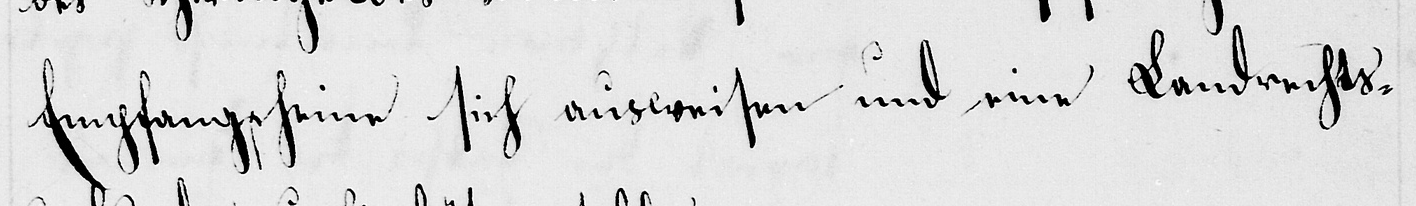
Empfangsscheine sich ausweisen und eine Landrechts¬
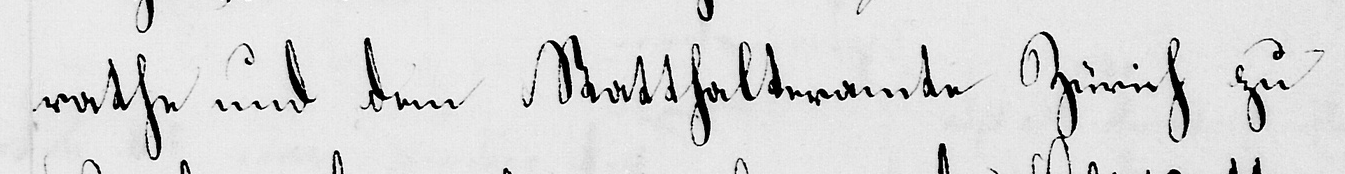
rathe und dem Statthalteramte Zürich zu
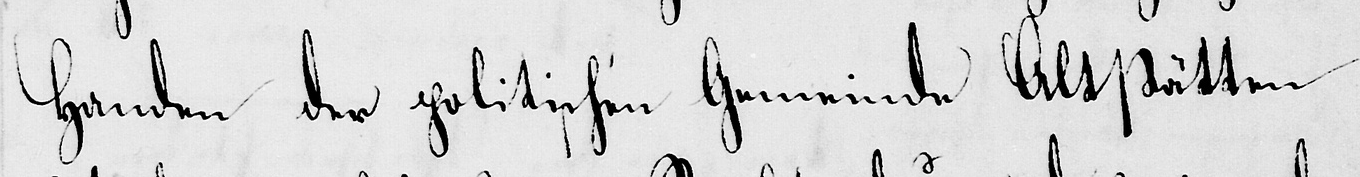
Handen der politischen Gemeinde Altstätten
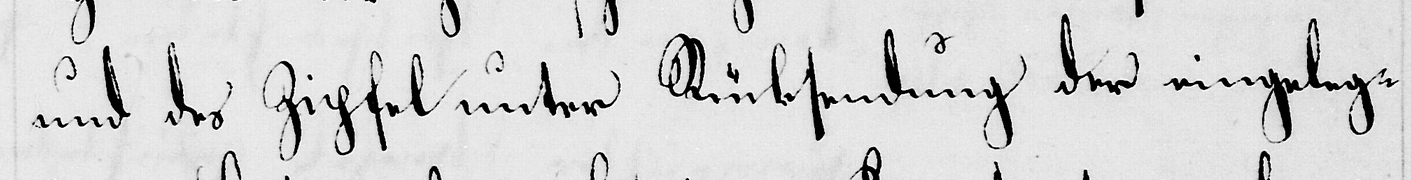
und des Zipfel unter Rücksendung der eingeleg¬
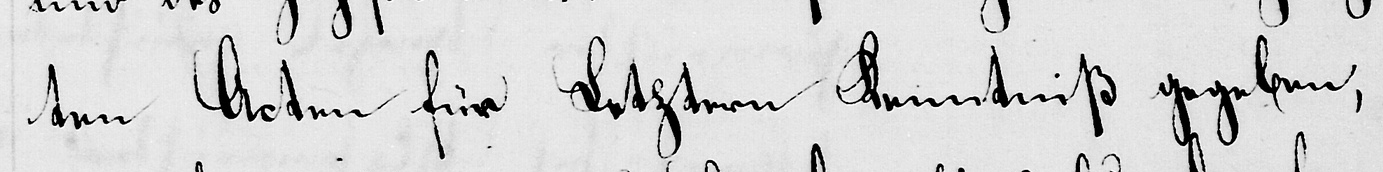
ten Acten für Letzern Kenntniß gegeben,
